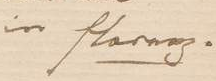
in Florenz.
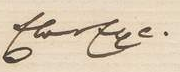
Eure Exc.
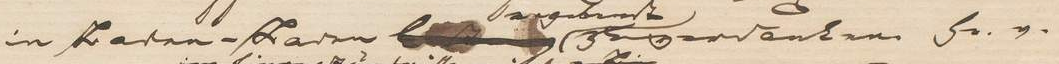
in Baden-Badenbestensergebenst zu verdanken. Hr. v.
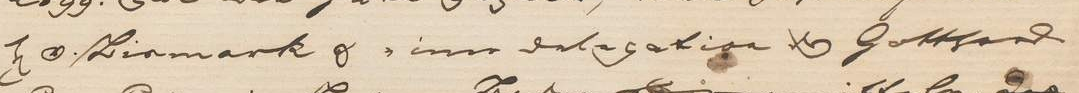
Herrn v. Bismark & einer Delegation des Gotthard -
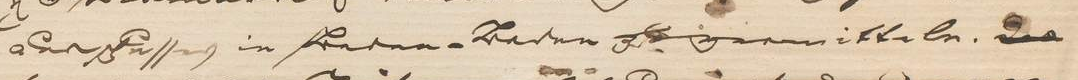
ausschusses in Baden-Baden zu vermitteln. Das
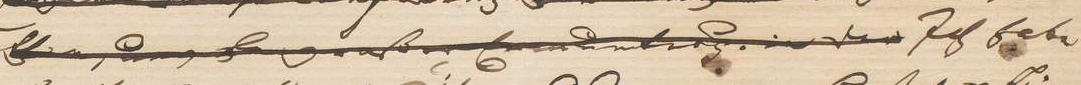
than, uns zu großer Ermunterg. in der Ich habe
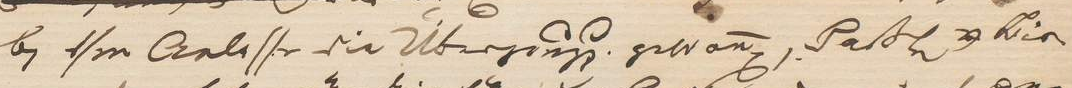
bei dsm Anlasse die Überzeugg. gewonnen, daß Herr v. Bis-
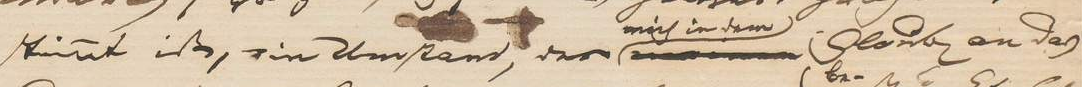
stimmt ist, ein Umstand, der meinemmich in dem Glauben an das
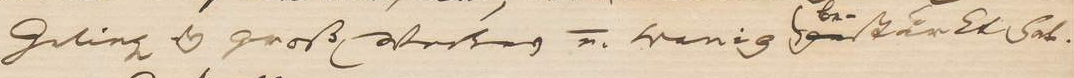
Gelingen des großen Werkes n. wenig gebestärkt hat.
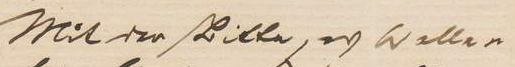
Mit der Bitte, es wollen
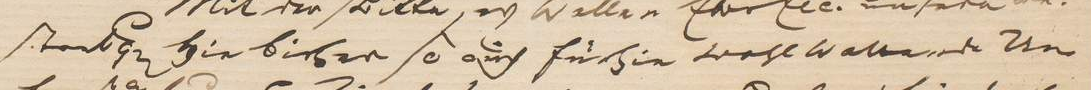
strebungen wie bisher so auch fürhin wohlwollende Un-
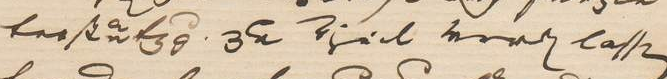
terstützg. zu Theil werden lassen &
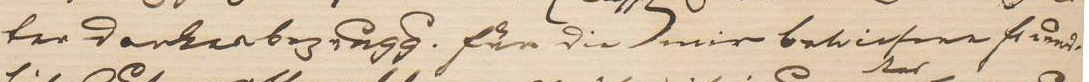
ter Dankesbezeugg. für die mir bewiesene freund-
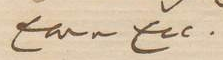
Eurer Exc.
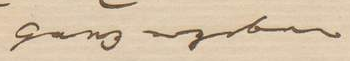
ganz ergebene
